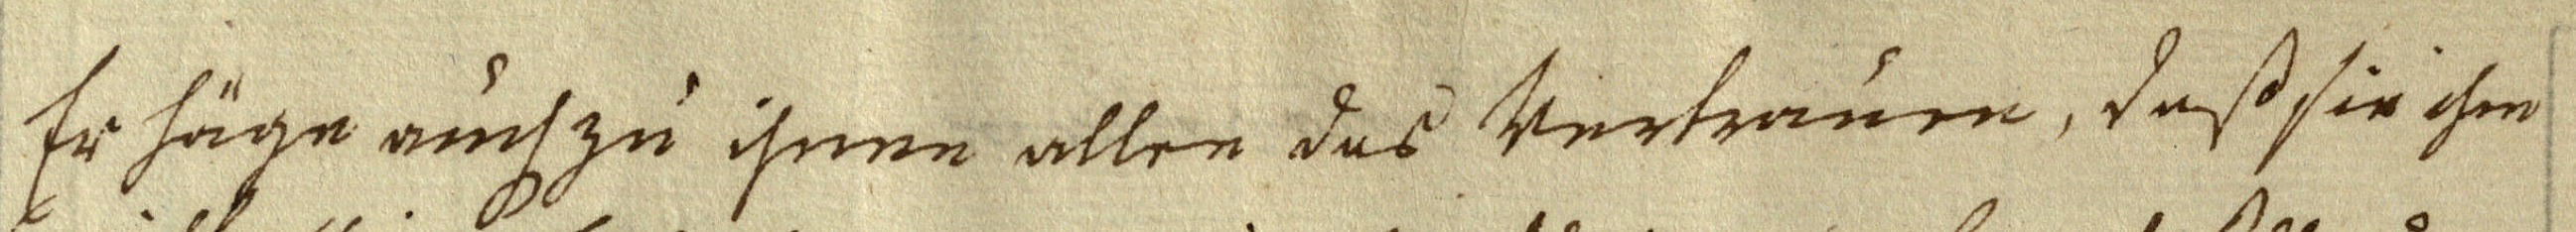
Er häge auch zu ihnen allen das Vertrauen, daß sie ihm
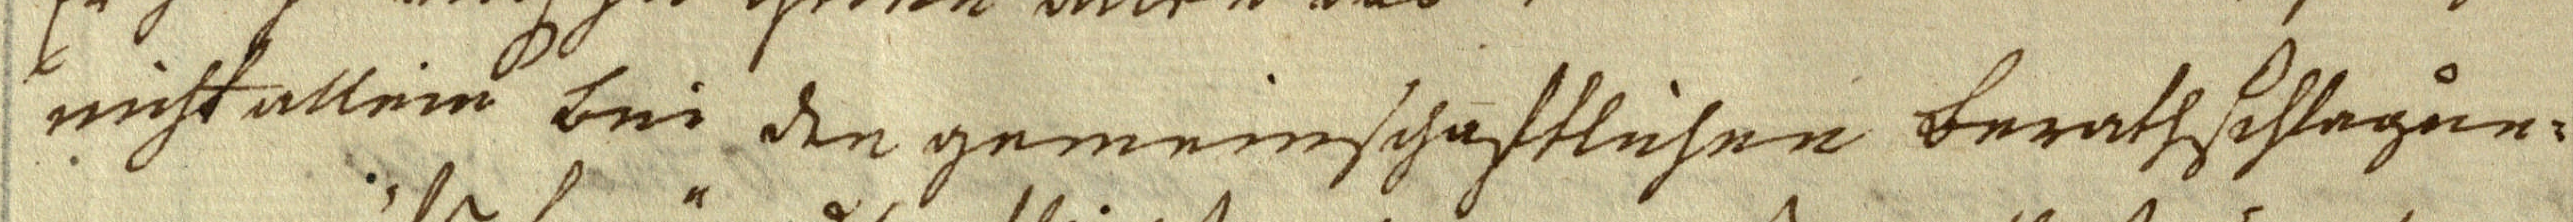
nicht allein bei den gemeinschaftlichen Berathschlagun¬
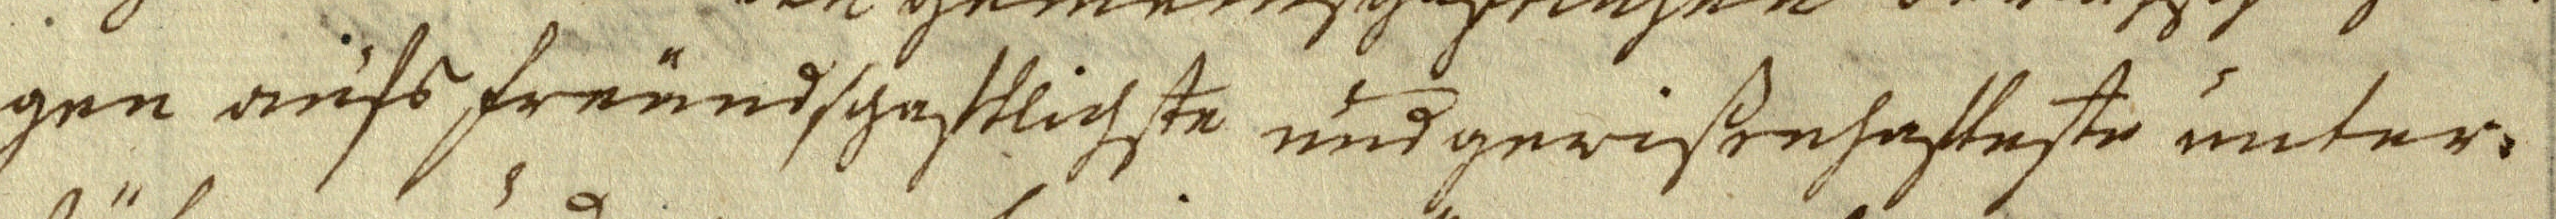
gen aufs freundschaftlichste und gewißenhafteste unter¬
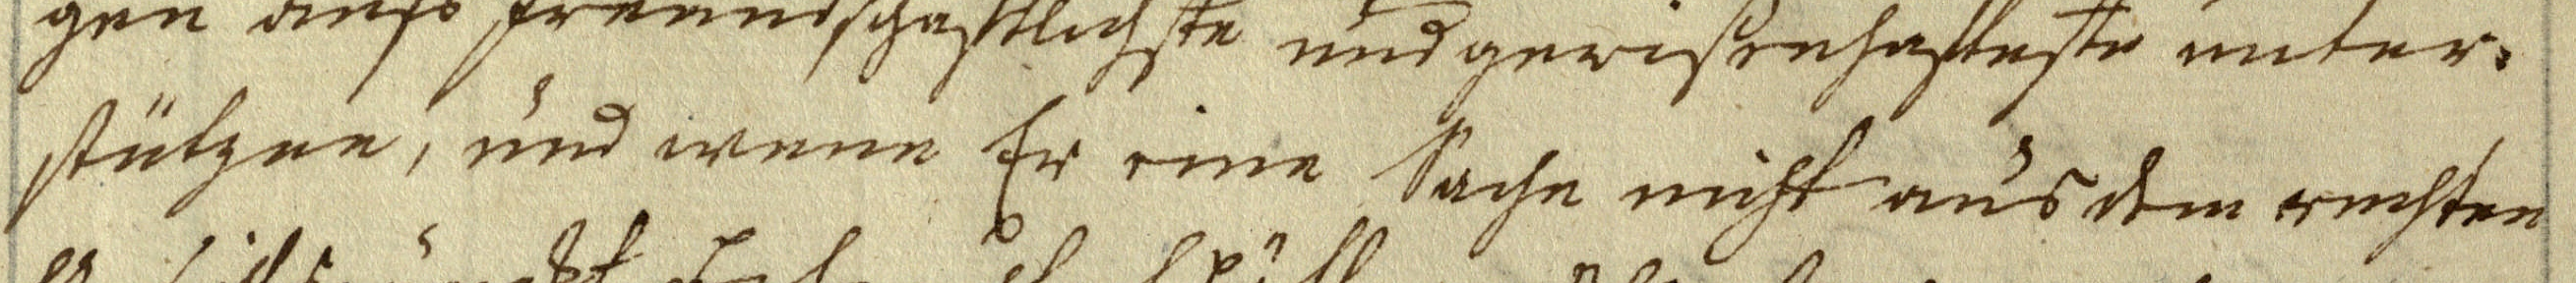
stützen, und wenn Er eine Sache nicht aus dem rechten
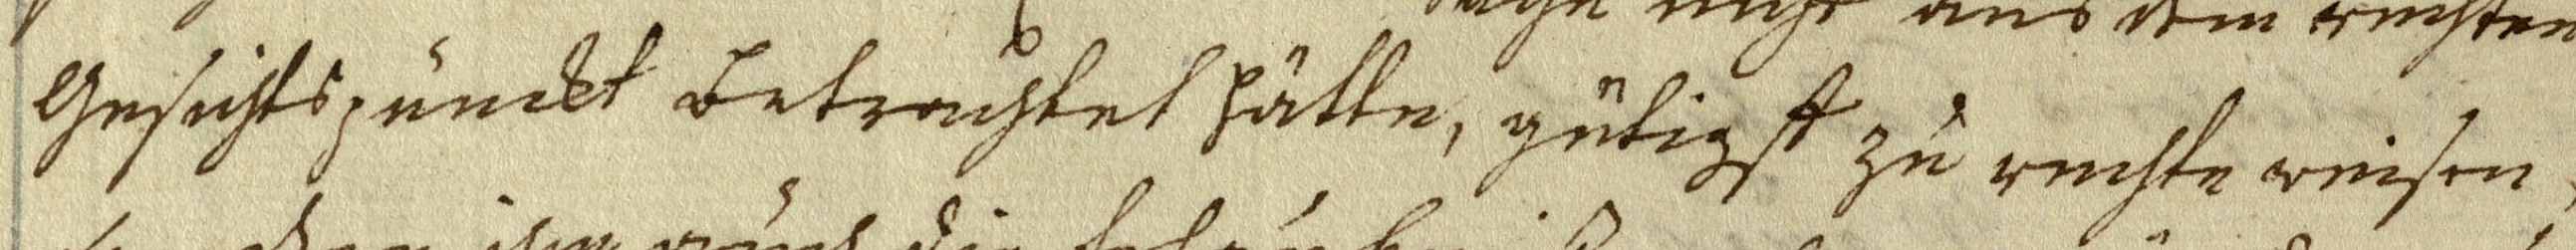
Gesichtspunckt betrachtet hätte, gütigst zu rechte weisen,
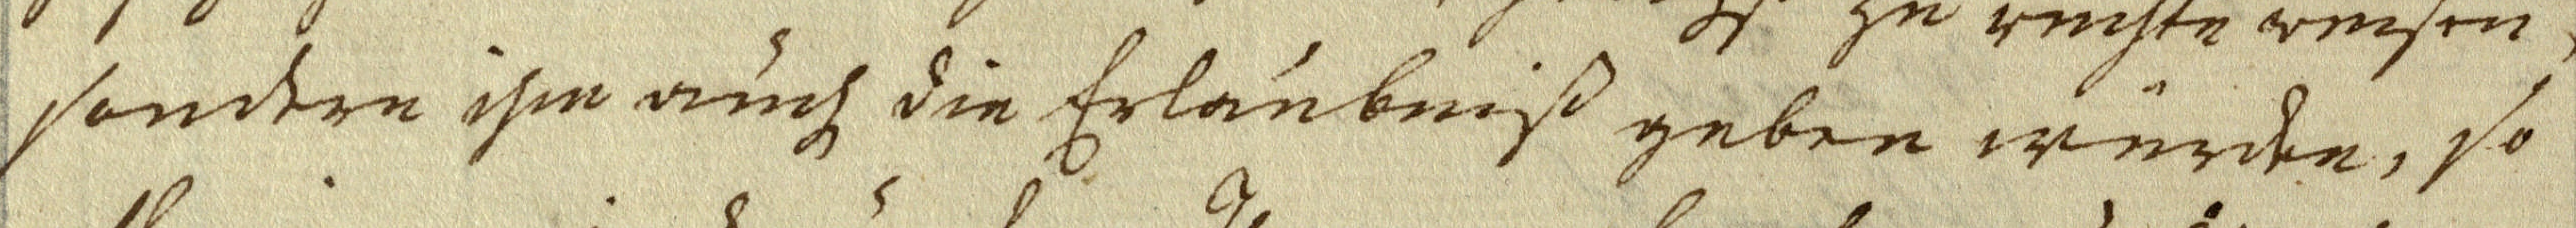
sondern ihm auch die Erlaubniß geben würden, so
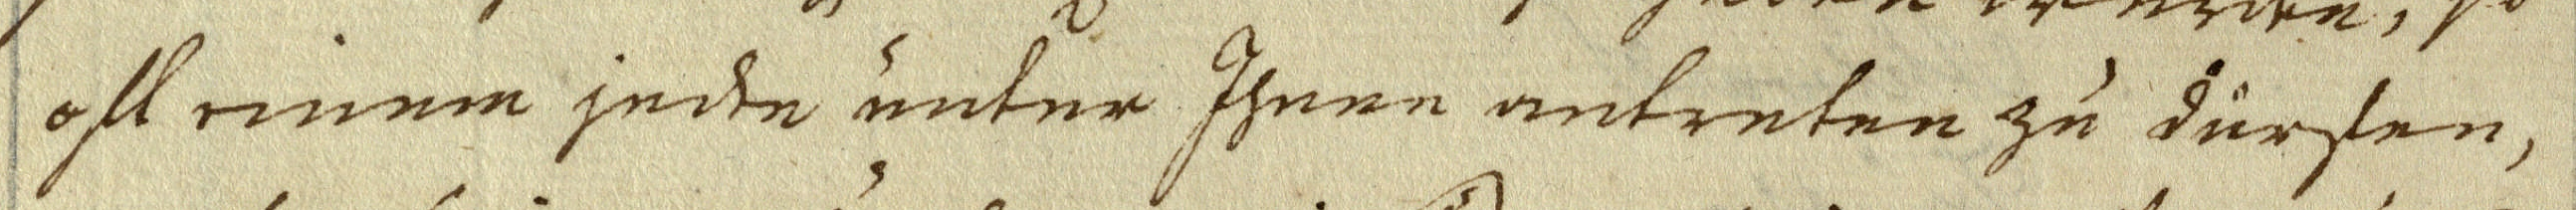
oft einem jeden unter Ihnen antreten zu dürfen,
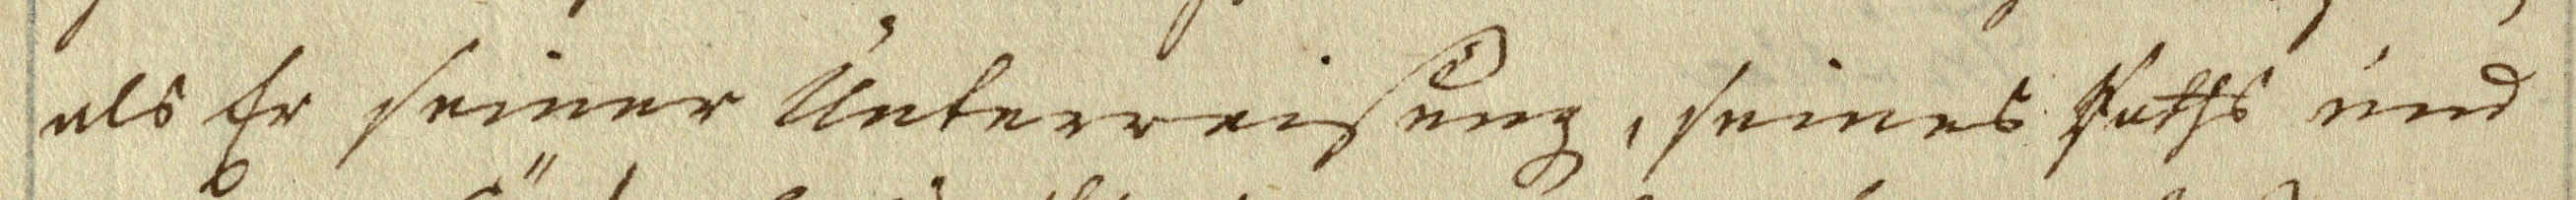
als Er seiner Unterweisung, seines Raths und
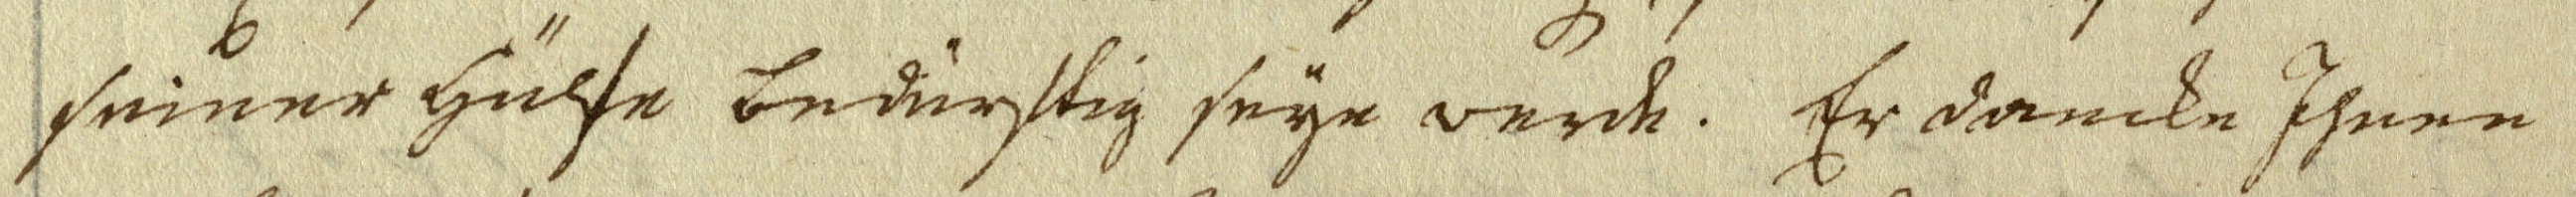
seiner Hülfe bedürftig seÿn werde. Er dancke Ihnen
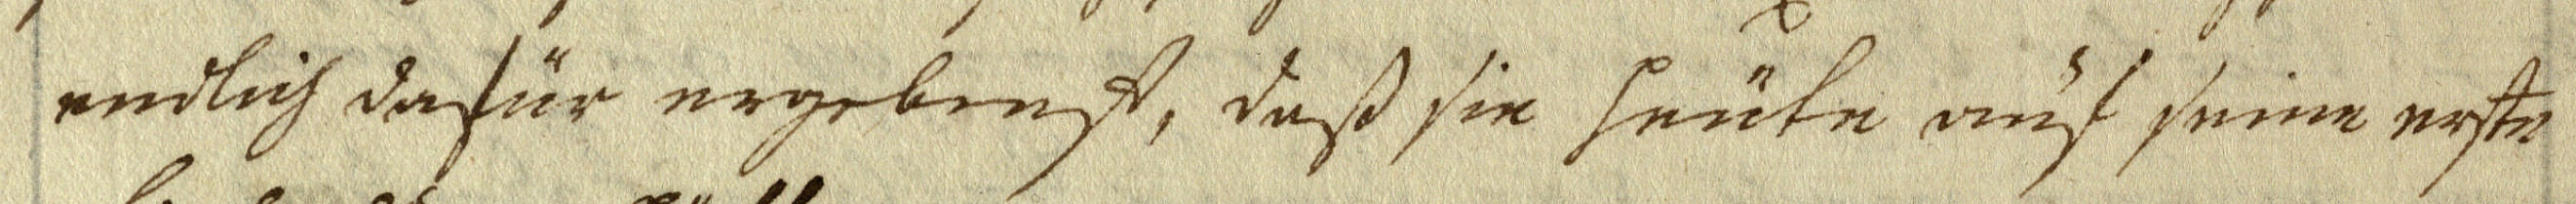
endlich dafür ergebenst, daß sie heute auf seine erste
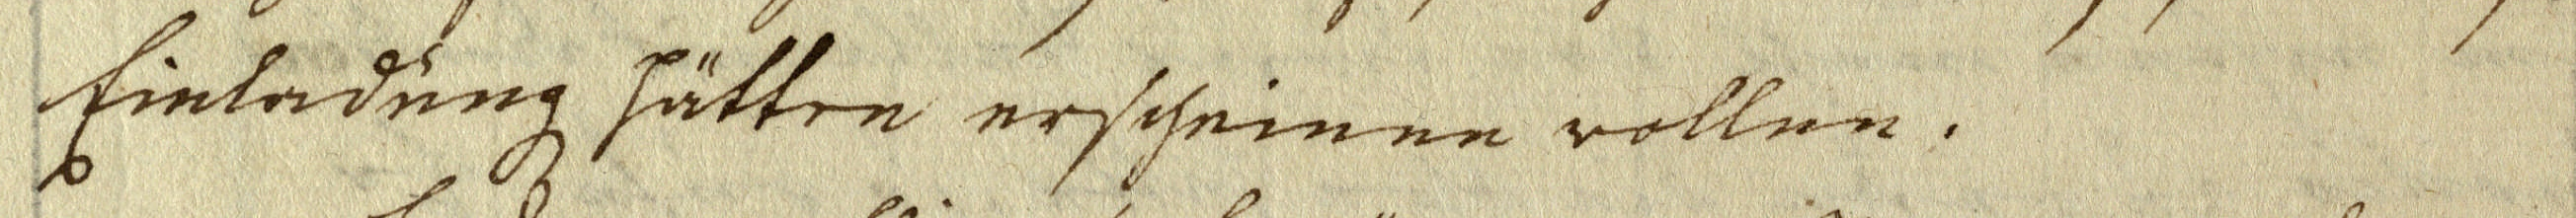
Einladung hätten erscheinen wollen.
